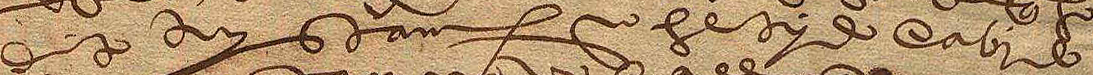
dito trystam frco he tydo e avjdo
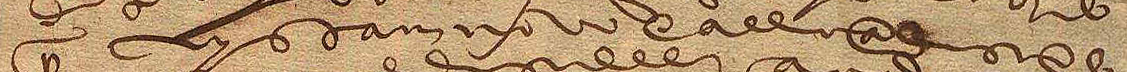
p̄o crystam novo e all nā dise e do
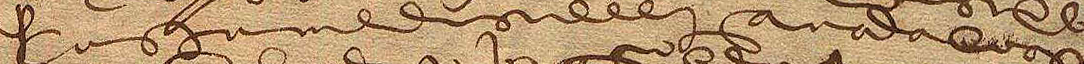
custume dise elle ta nada e o asj
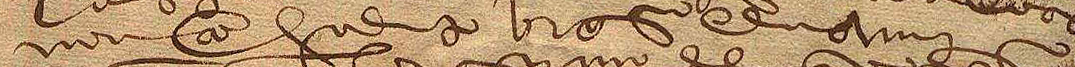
nou c̄o ho dito vigro e eu Amto
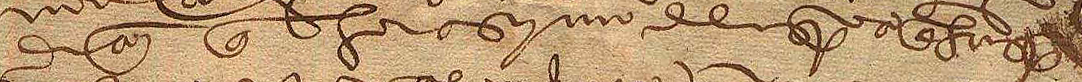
diaz q̄ hora syruo de esp̄vā q̄ ho esp̄
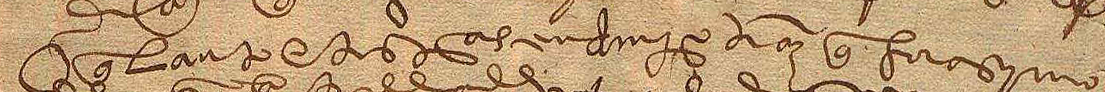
O q̄l auto e testas eu Amto diaz q̄ hora syruo
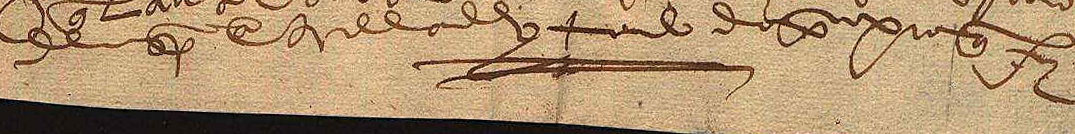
de esp̄vā trelladey tudo do p̄ropio q̄ fiz
